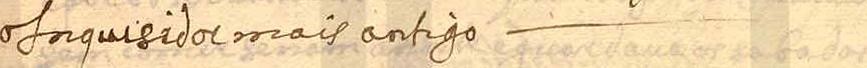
o Jnquisidor mais antigo
